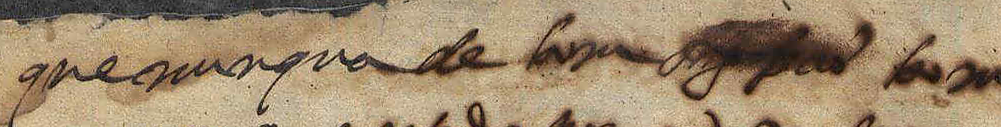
que nunqua de hora christaõ hora
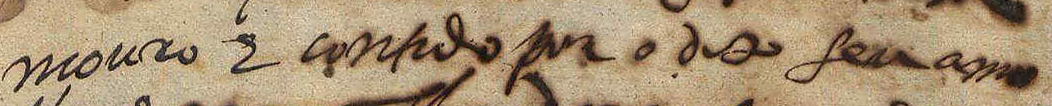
mouro E contido por o dito seu amo
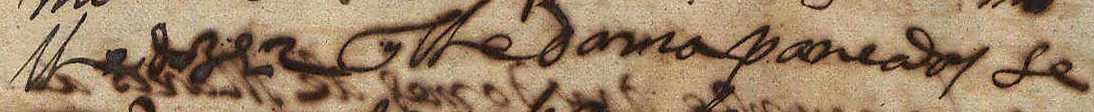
lhe dizer q̄ lhe daria pancadas se
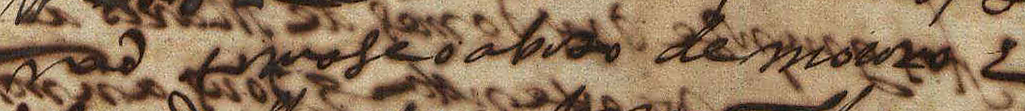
naõ tomase o abito de mouro E
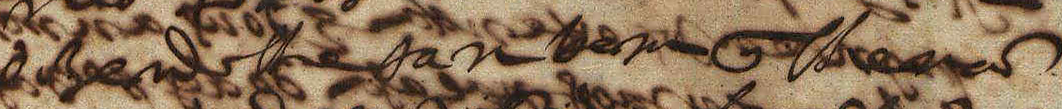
dizendolhe tanbem q̄ lhe naõ
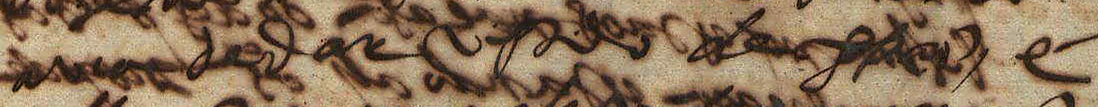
avia dadar uestido de xpaõ e
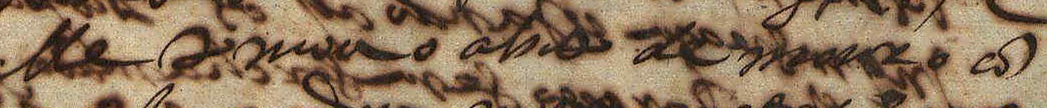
elle tomou o abito de mouro cō
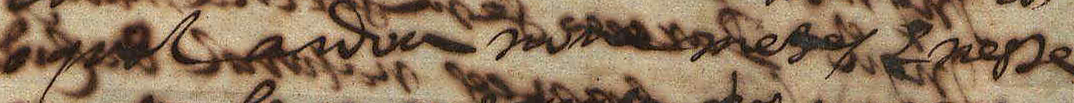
o qual andou noue meses E neste
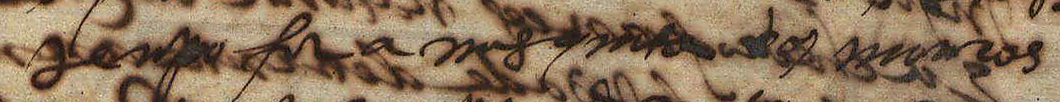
tenpo foi a mesquita dos mouros
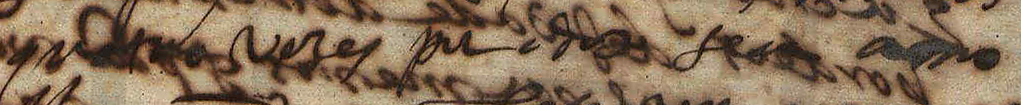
quatro uezes por o dito seu amo
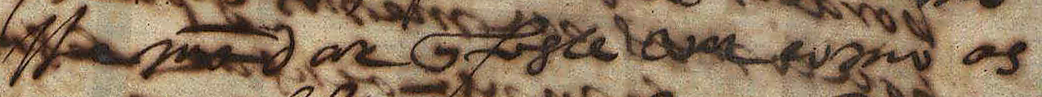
lhe mādar q̄ fosce ver como os
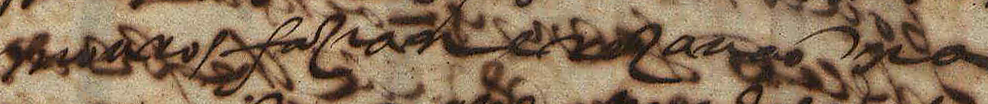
mouros fazian e rezauaõ na
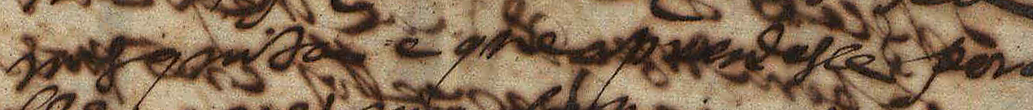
mesquita e que aprendesse pera
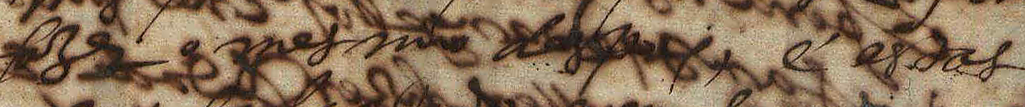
fazer o mesmo despojs, e estas
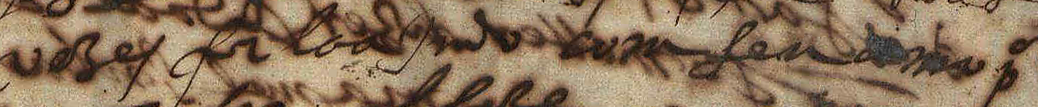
vezes foi laa Indo com seu amo por
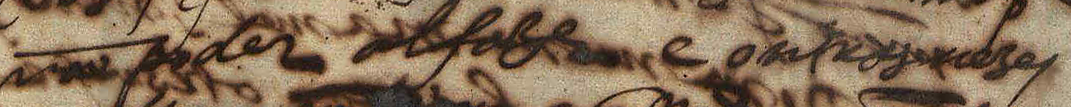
nā poder alfazer e outras uezes
